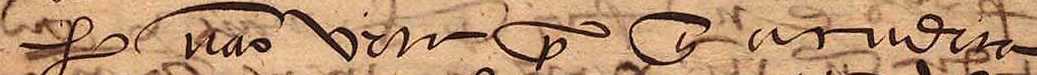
ho não vyra p̄oq̄ acudyra
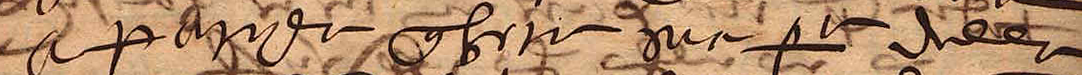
a paryda q̄ hera sua fa della
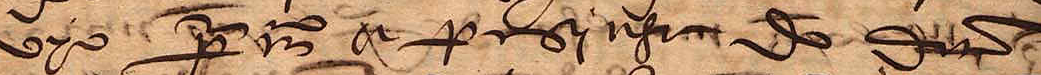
vyo prmro a pesynha do dito
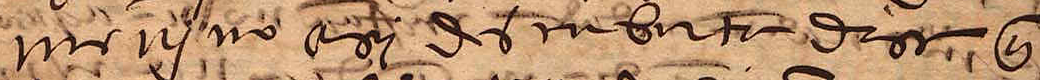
menjno asy descuberta dise q̄
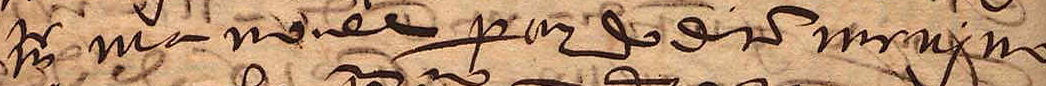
mte manoell pay do dito menjno
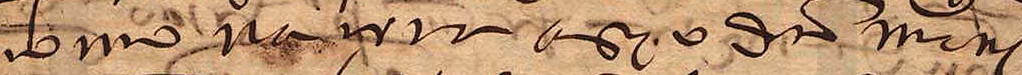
como naçera asy o dito menj
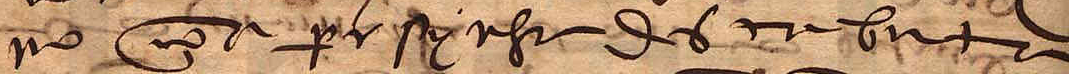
no ç̄o a pesynha descuberta
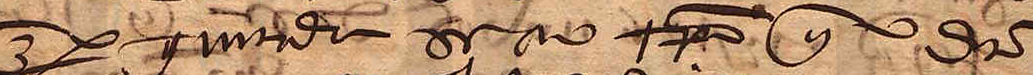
item ꝑguntada se ao tp̄o q̄ o dito
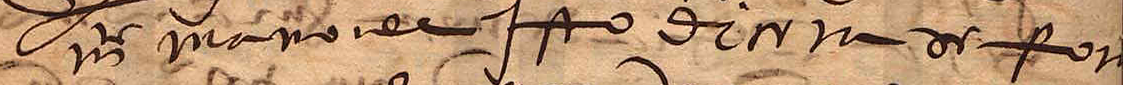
mte manoell Jsto dysera se for
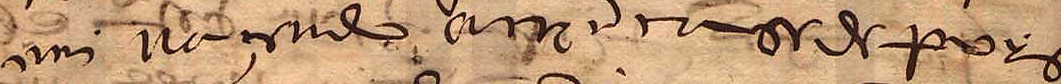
em naçendo a cryenca se depoys
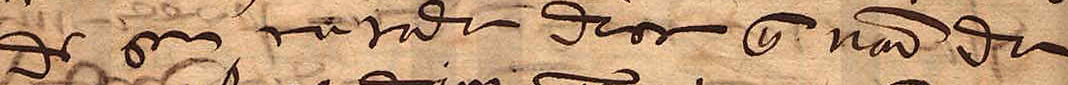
de ser curada dise q̄ não da
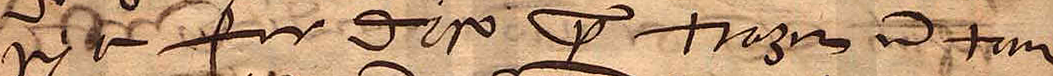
rya fee dyso p̄o trazer ētam
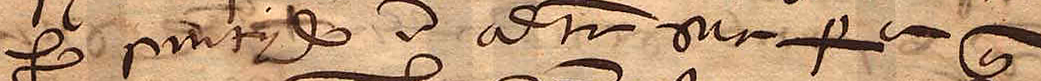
ho sentydo ē a dita sua fa q̄
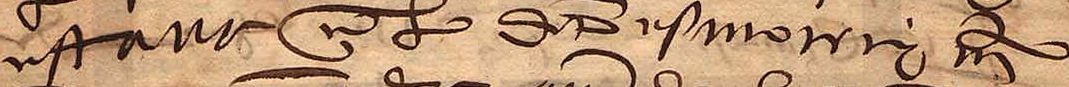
estaua ç̄o ho dito esmorecymto
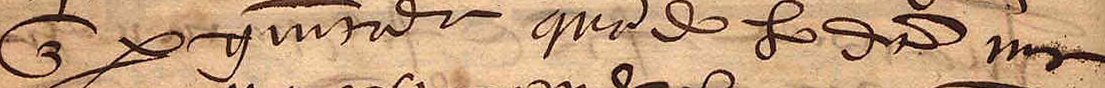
item ꝑgūntada quādo ho dito me
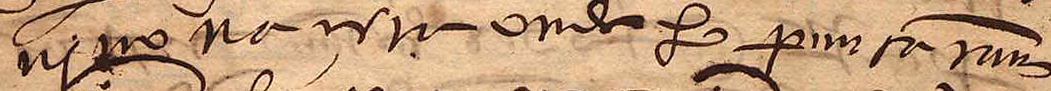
njno naçera onde ho pemsaram
